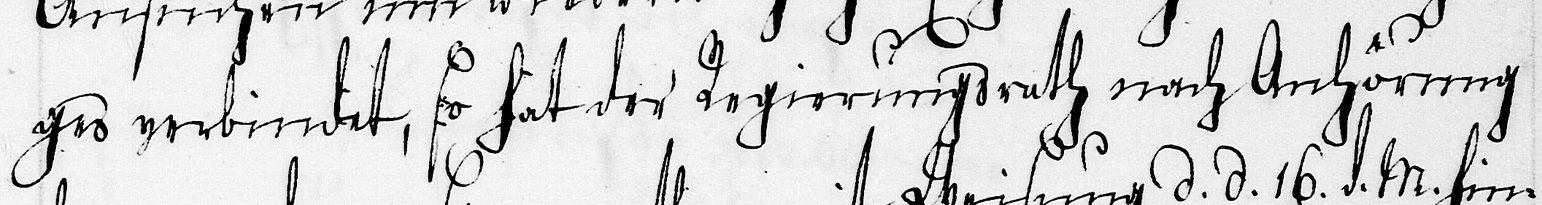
ges verbindet, so hat der Regierungsrath nach Anhörung
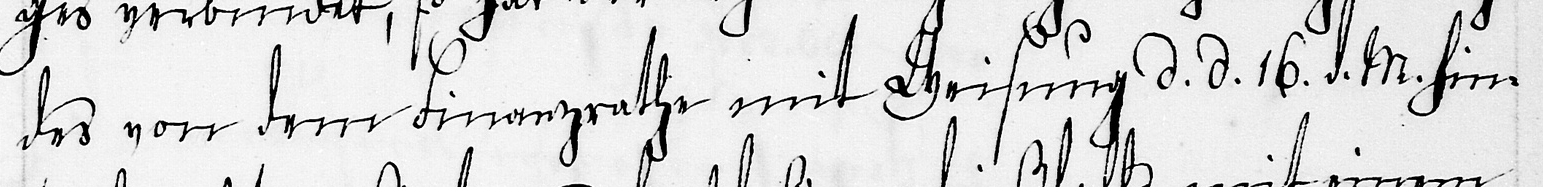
des von dem Finanzrathe mit Weisung d. d. 16. d. M. hin¬
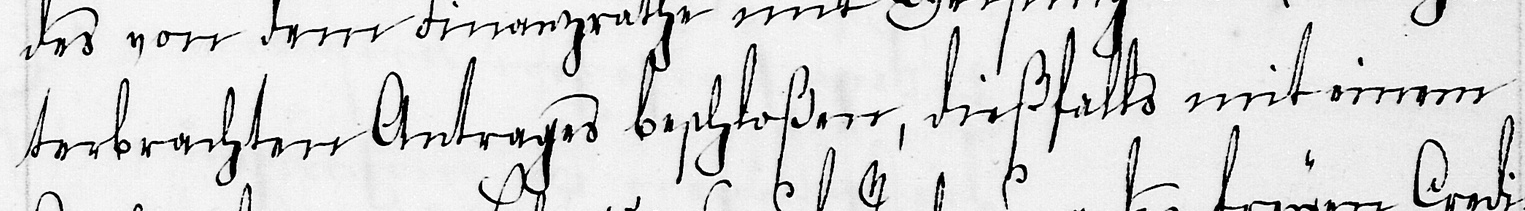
terbrachten Antrages beschloßen, dießfalls mit einem
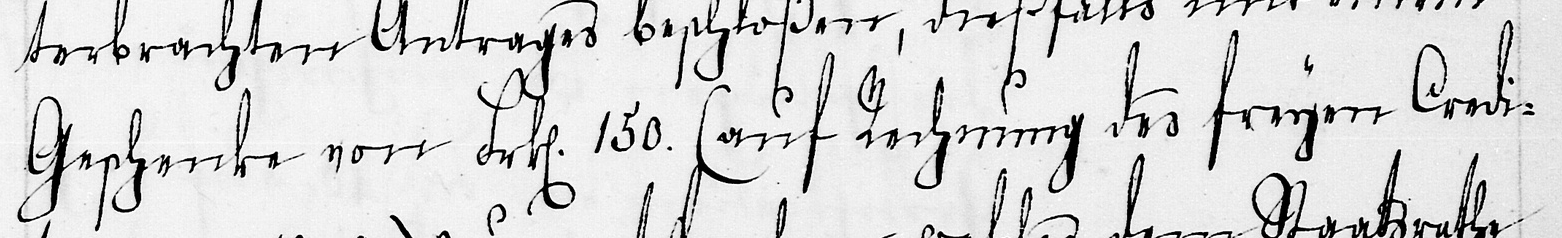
Geschenke von Frk[en]. 150. (auf Rechnung des freyen Credi¬
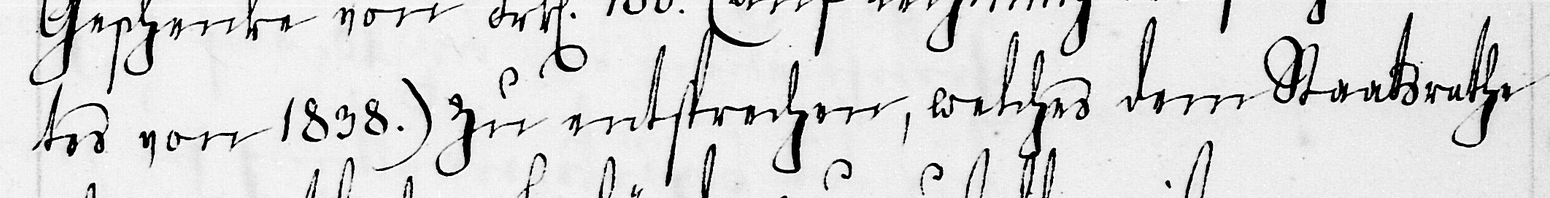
tes von 1838.) zu entsprechen, welches dem Staatsrathe
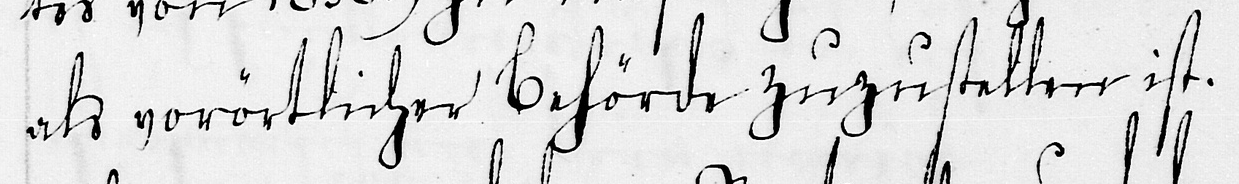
als vorörtlicher Behörde zuzustellen ist.
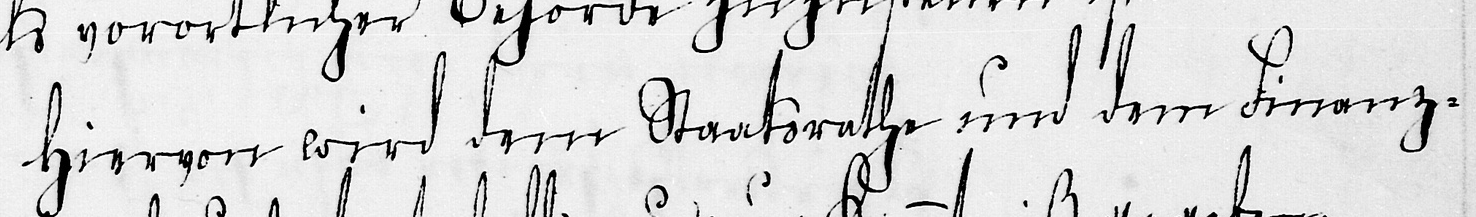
Hiervon wird dem Staatsrathe und dem Finanz¬
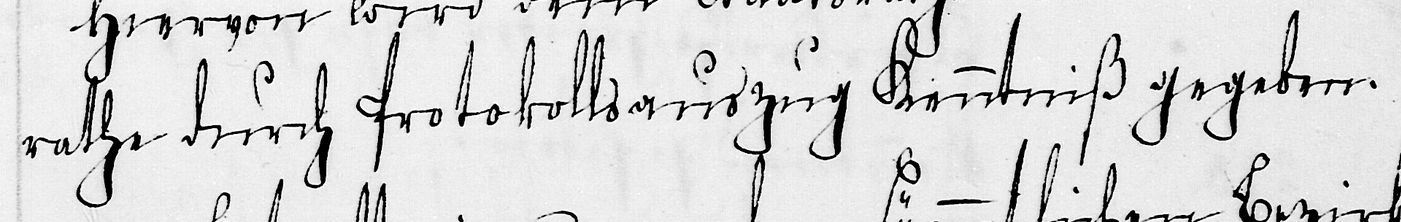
rathe durch Protokollsauszug Kenntniß gegeben.
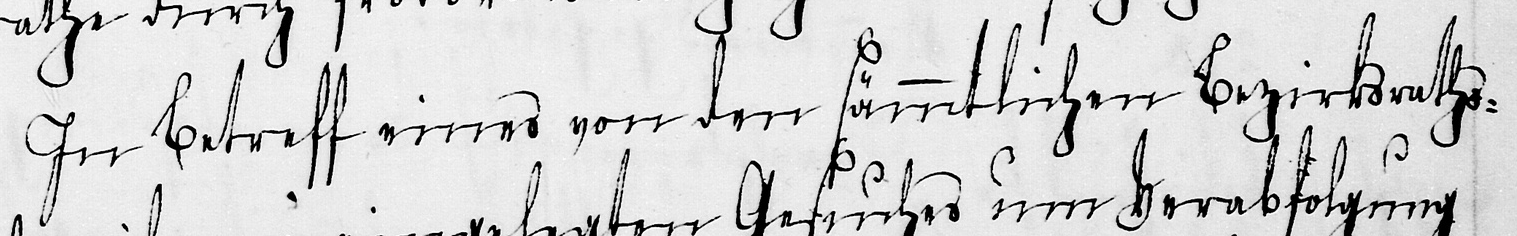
In Betreff eines von den sämmtlichen Bezirksraths¬
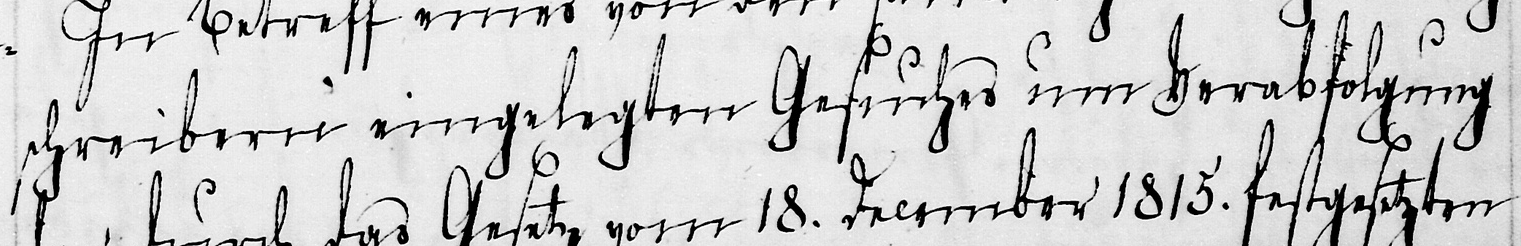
scheibern eingelegten Gesuches um Verabfolgung
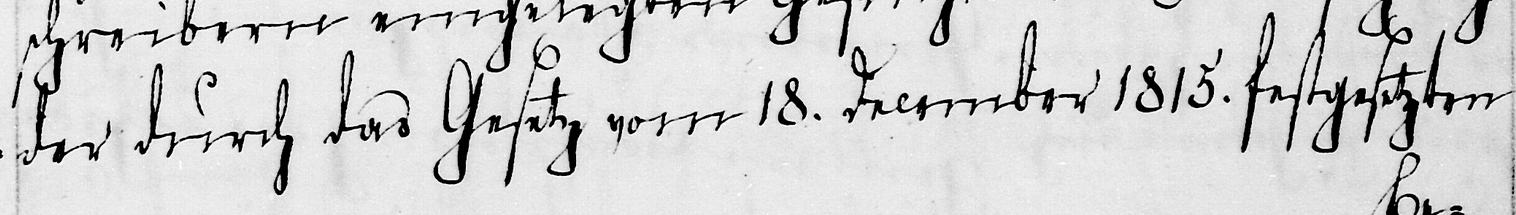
der durch das Gesetz vom 18. December 1815. festgesetzten
